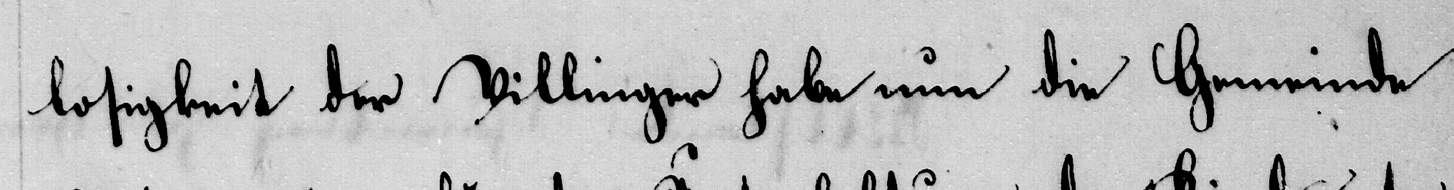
losigkeit der Villinger habe nun die Gemeinde
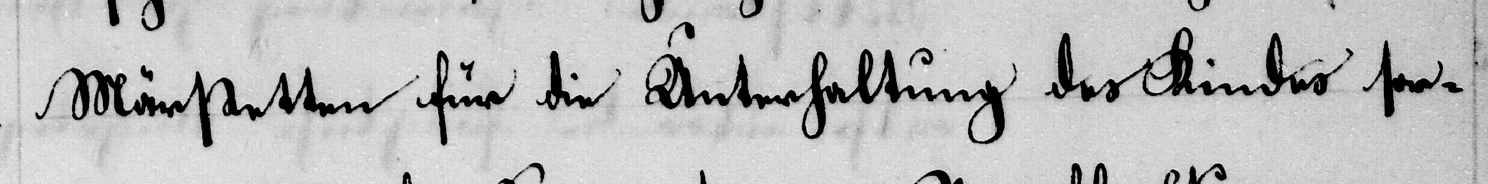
Märstetten für die Unterhaltung des Kindes sor¬
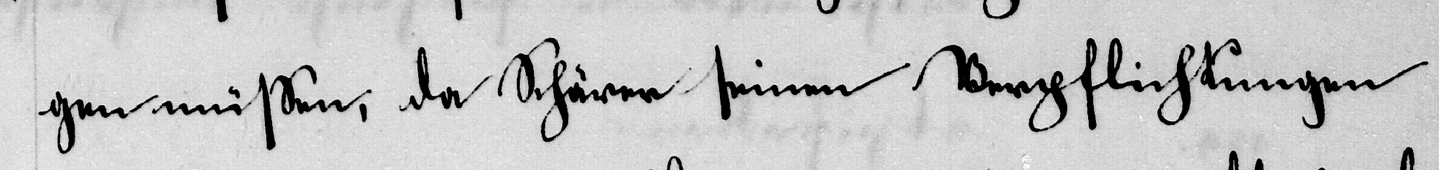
gen müßen, da Schärer seinen Verpflichtungen
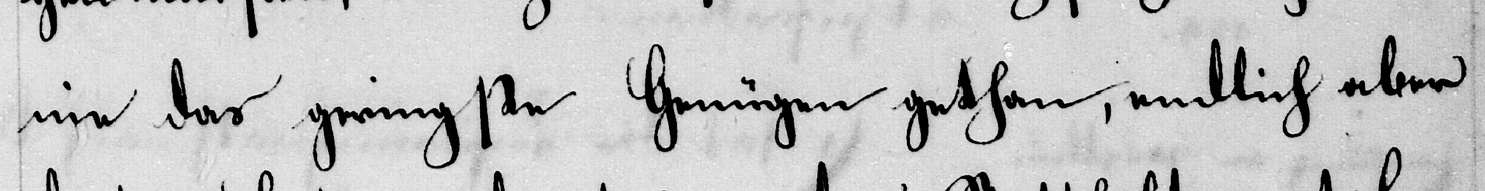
nie das geringste Genügen gethan, endlich aber
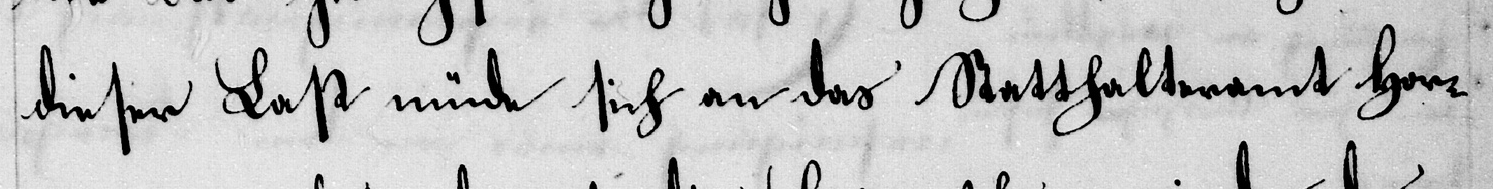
dieser Last müde sich an das Statthalteramt Hor¬
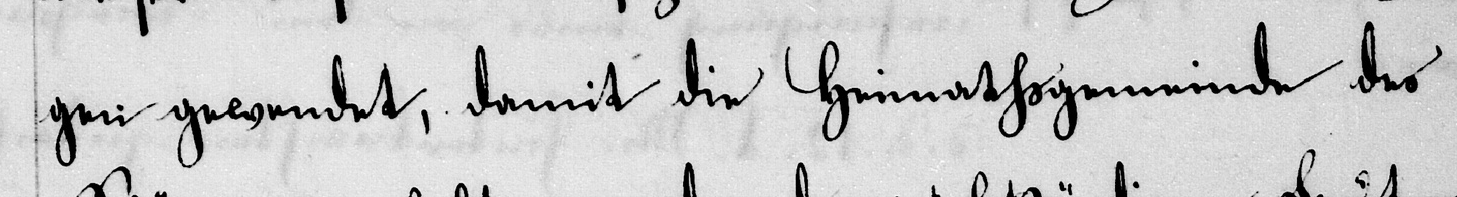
gen gewendet, damit die Heimathsgemeinde des
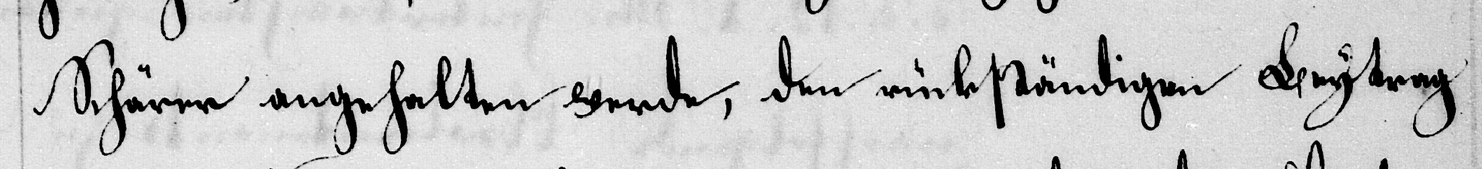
Schärer angehalten werde, den rückständigen Beytrag
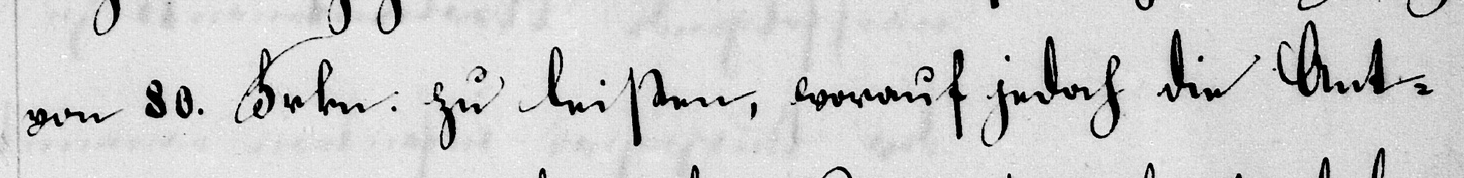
von 80. Frkn. zu leisten, worauf jedoch die Ant¬
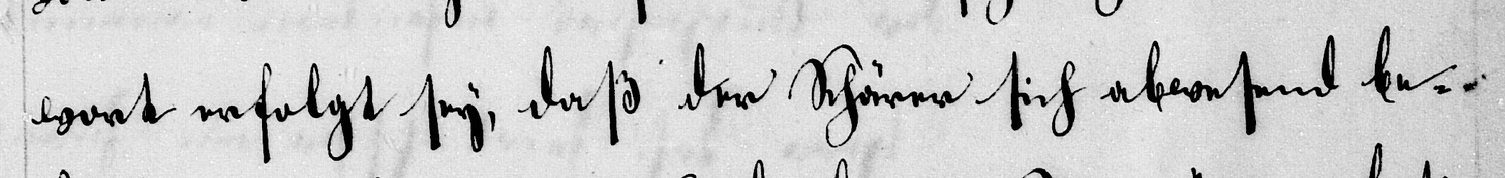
wort erfolgt sey, daß der Schärer sich abwesend be¬
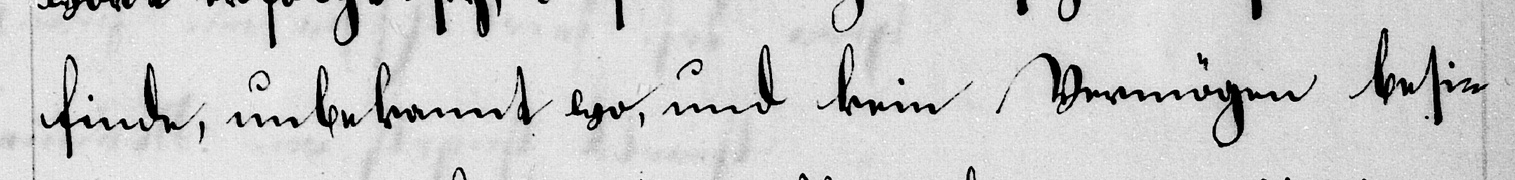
finde, unbekannt wo, und kein Vermögen besi¬
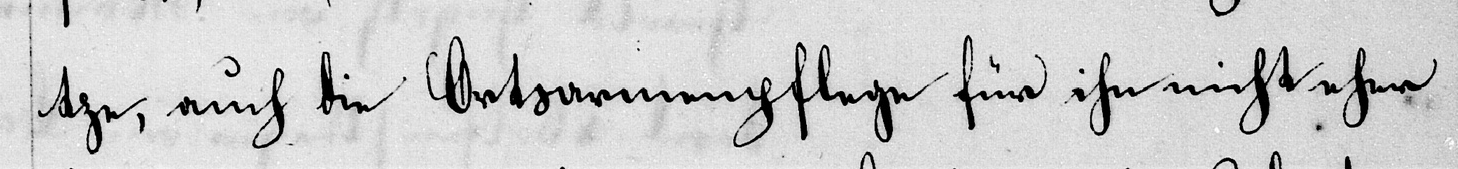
tze, auch die Ortsarmenpflege für ihn nicht eher
